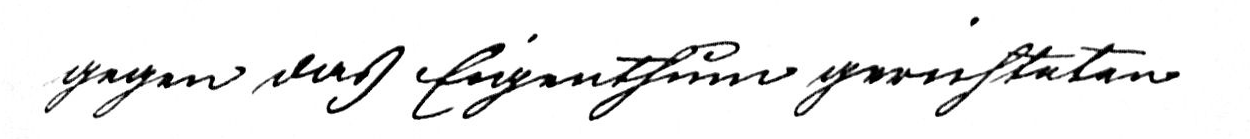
gegen das Eigenthum gerichteten
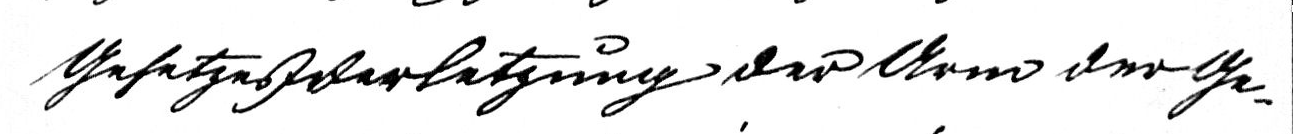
Gesetzesverletzung der Arm der Ge¬
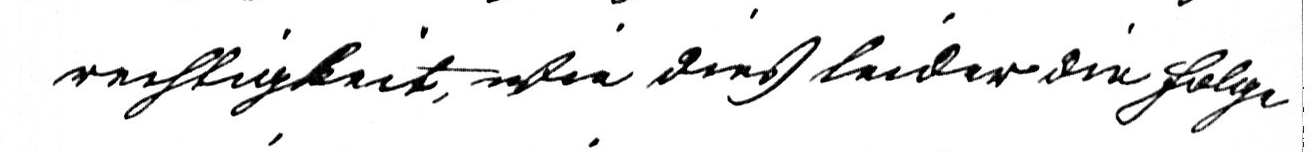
rechtigkeit, wie dies leider die Folge
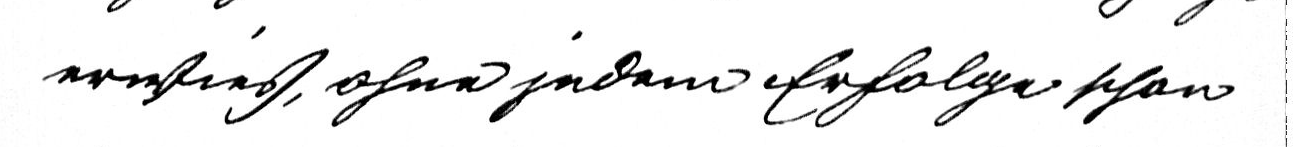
erwies, ohne jedem Erfolge schon
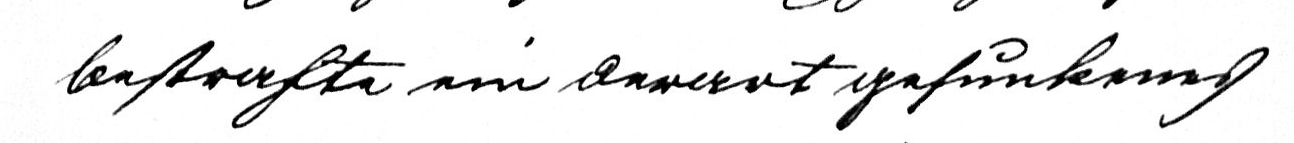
bestrafte ein derart gesunkenes
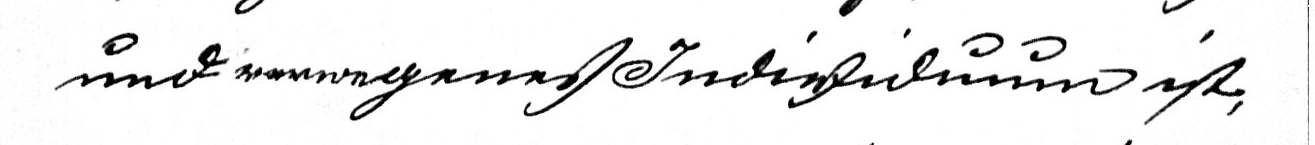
und verwegenes Individuum ist,
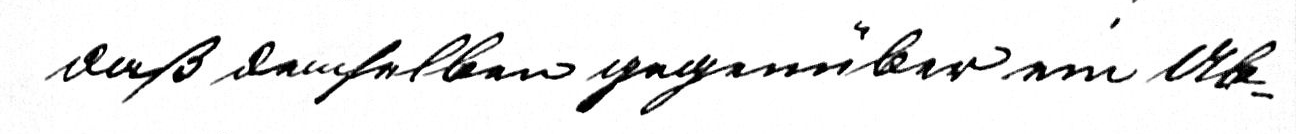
daß demselben gegenüber ein Ab¬
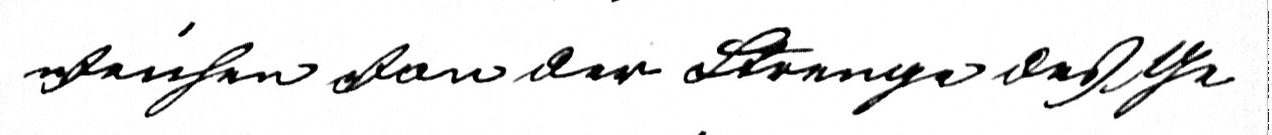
weichen von der Strenge es Ge¬
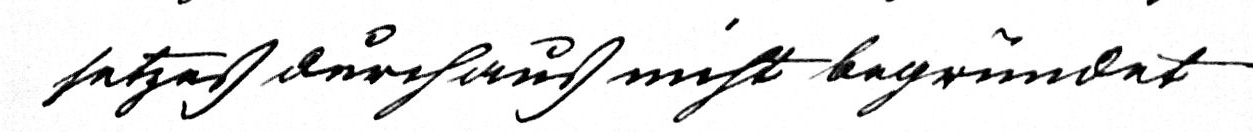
setzes durchaus nicht begründet
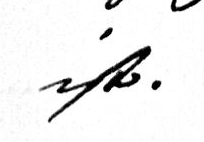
ist.
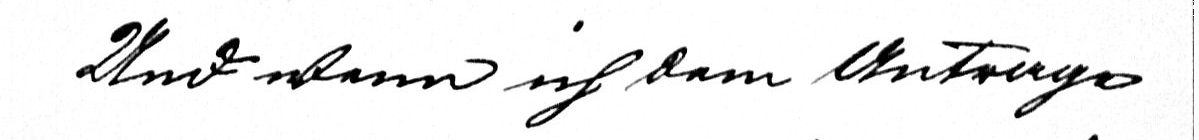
Und wenn ich dem Antrage
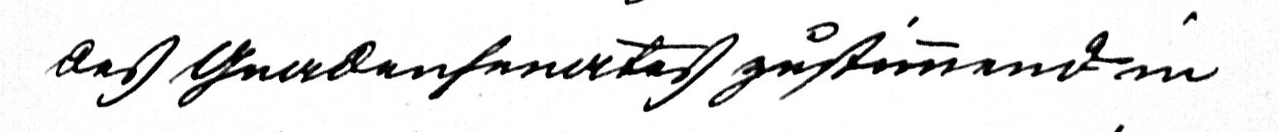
des Gnadensenates zustimmend in
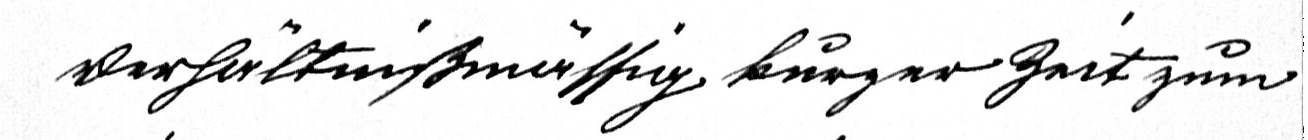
verhältnißmässig kurzer Zeit zum
